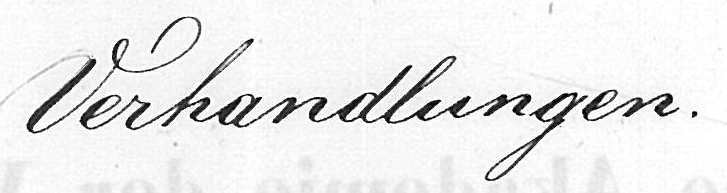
Verhandlungen.
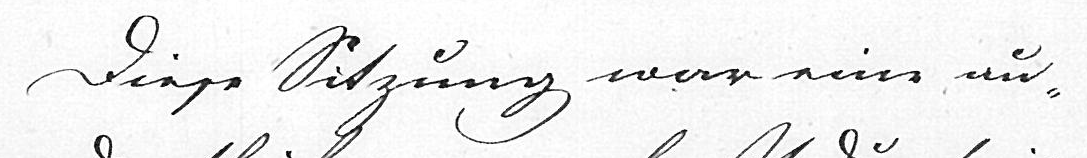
Diese Sitzung war eine au-
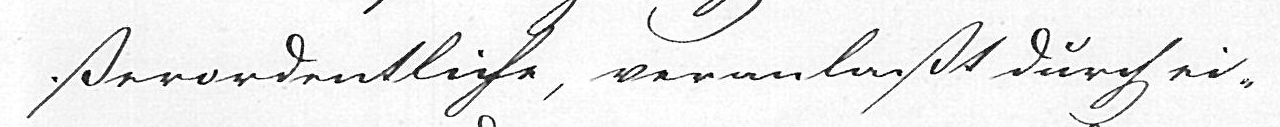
ßerordentliche, veranlaßt durch ei-
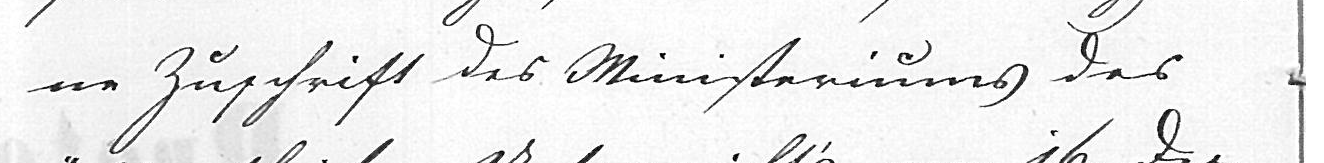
er Zuschrift des Ministeriums des
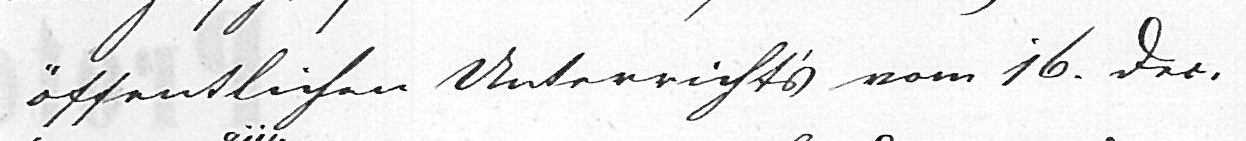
öffentlichen Unterricht's vom 16. Dec.
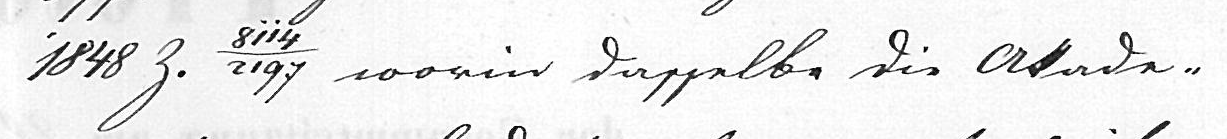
1848 Z. 8114/2197 worin dasselbe die Akade-
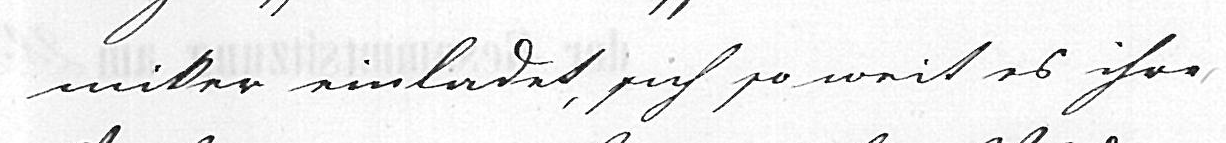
miker einladet, sich so weit es ihre
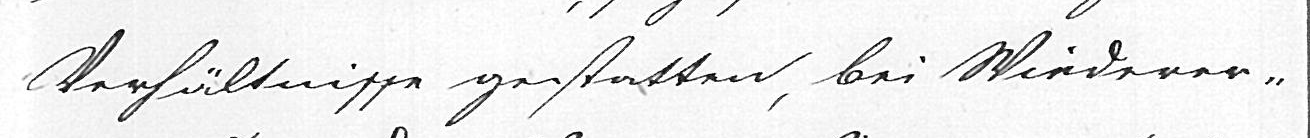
Verhältnisse gestatten bei Wiederer-
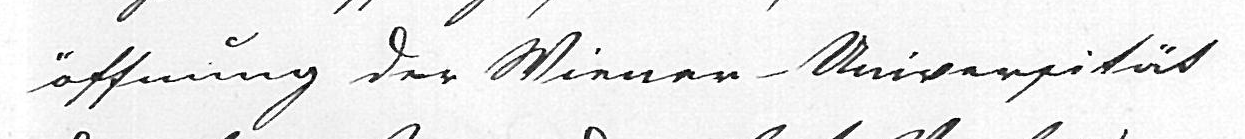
öffnung der Wiener-Universität
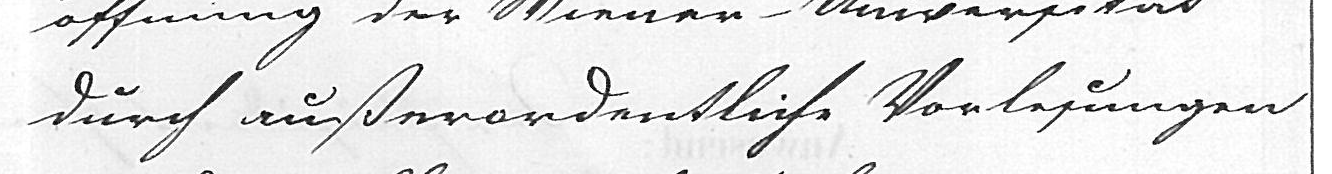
durch außerordentliche Vorlesungen
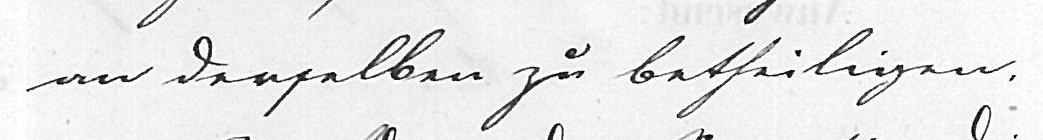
an derselben zu betheiligen.
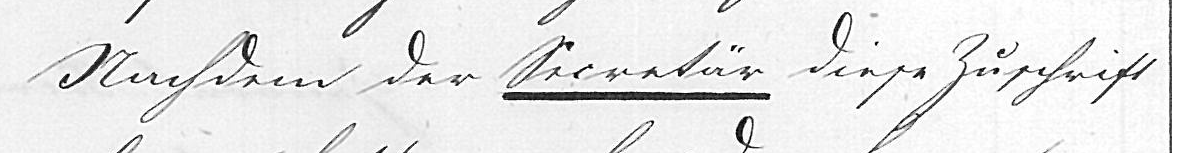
Nachdem der Secretär diese Zuschrift
